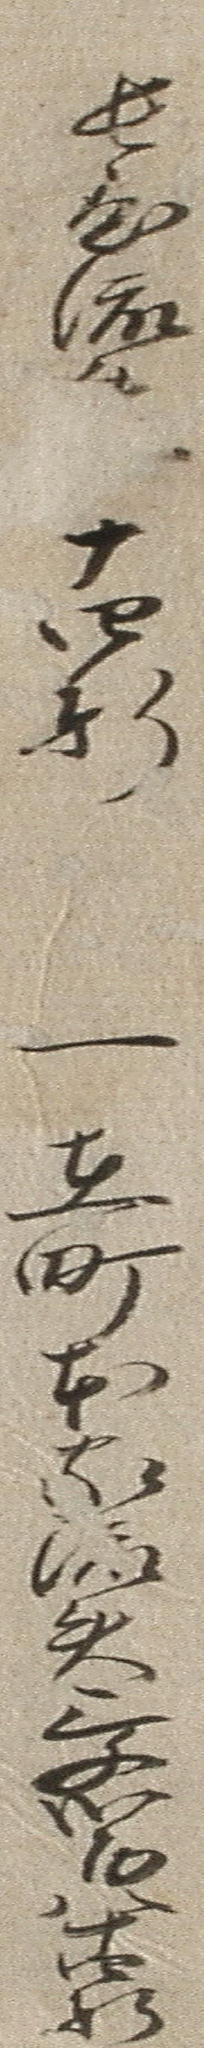長屋流失十四軒一在町本家流失三千弐百八十四軒
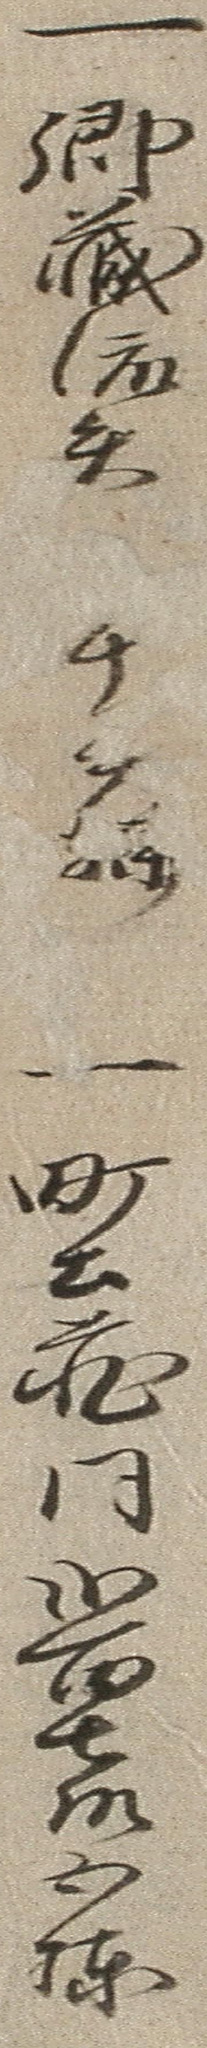一御蔵流失棟一町土蔵同弐百七拾五棟
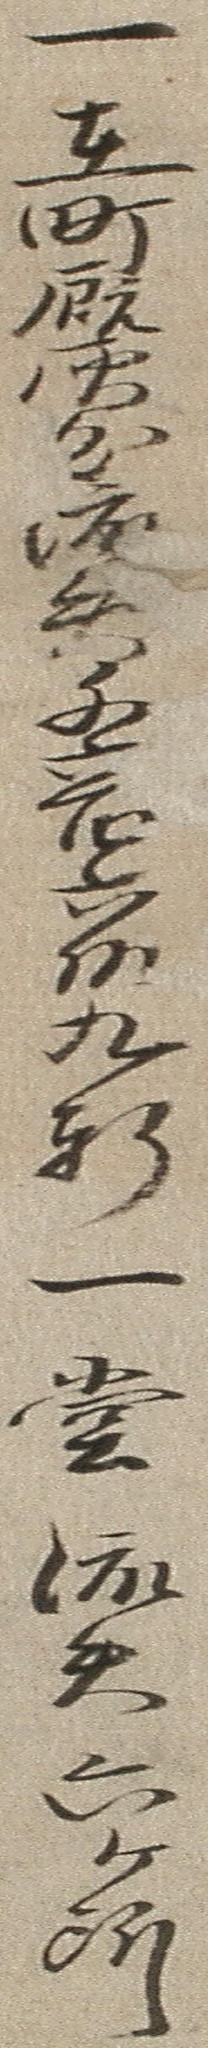一在町厩灰屋流失千六百六拾九軒一堂流失六ヶ所
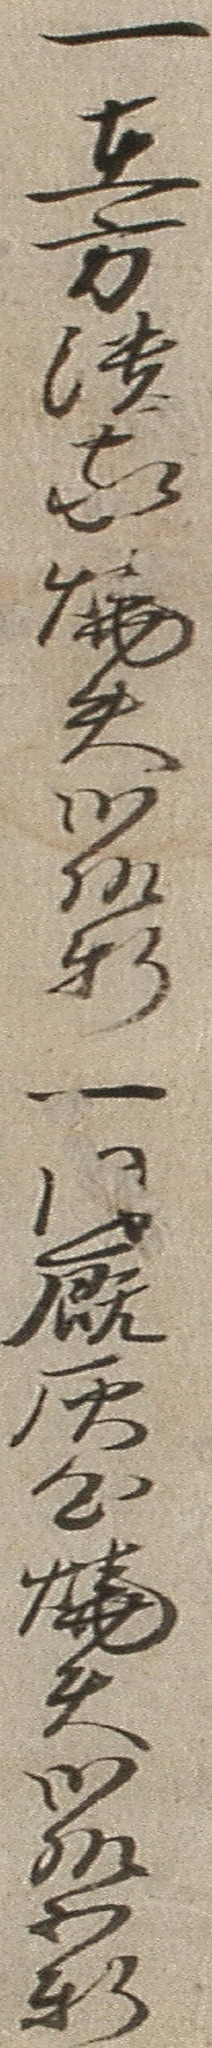一在方潰家焼失弐拾軒一同厩灰屋焼失弐拾五軒
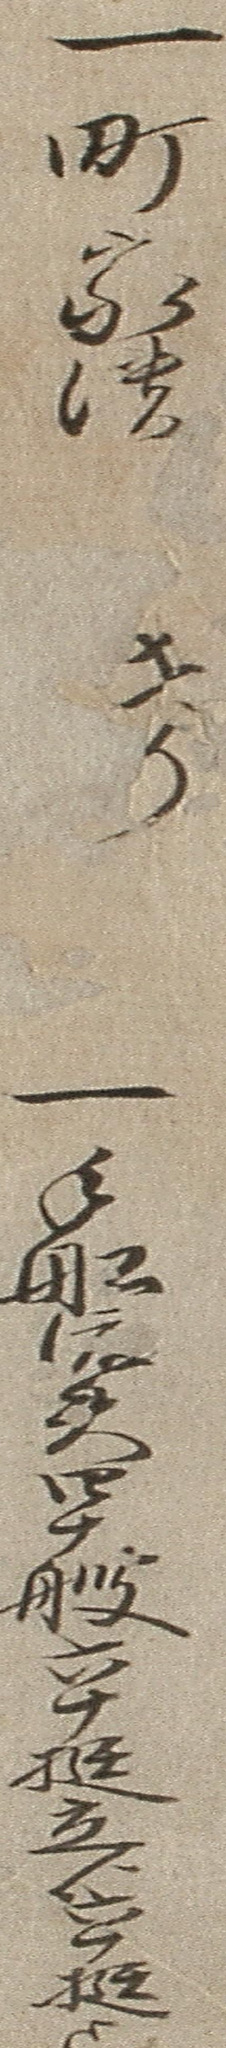一町家潰一手船流失四十艘六十挺立ゟ六十挺迄
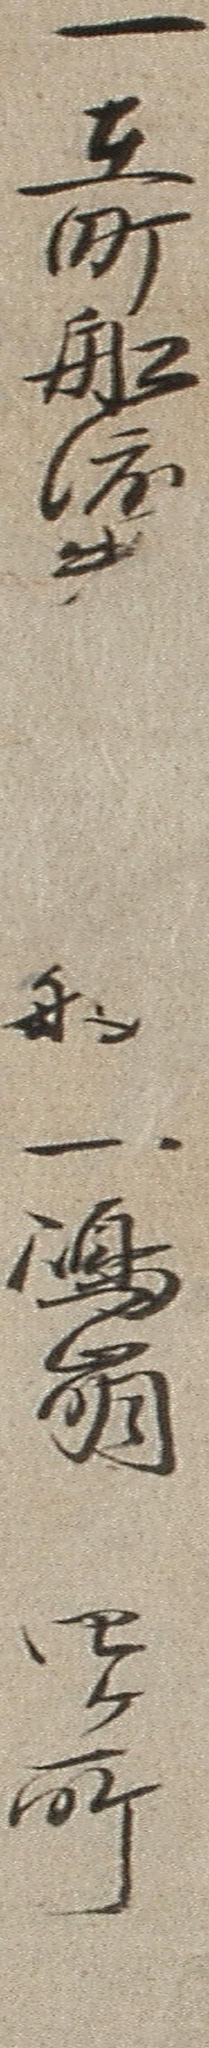一在町船流失艘一嶋崩四ヶ所
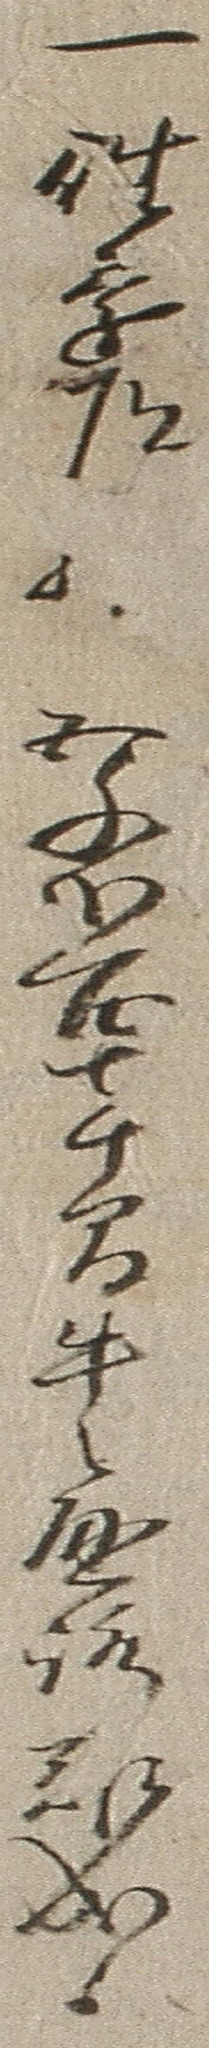一往還道五千弐百七十間牛之通路難成候
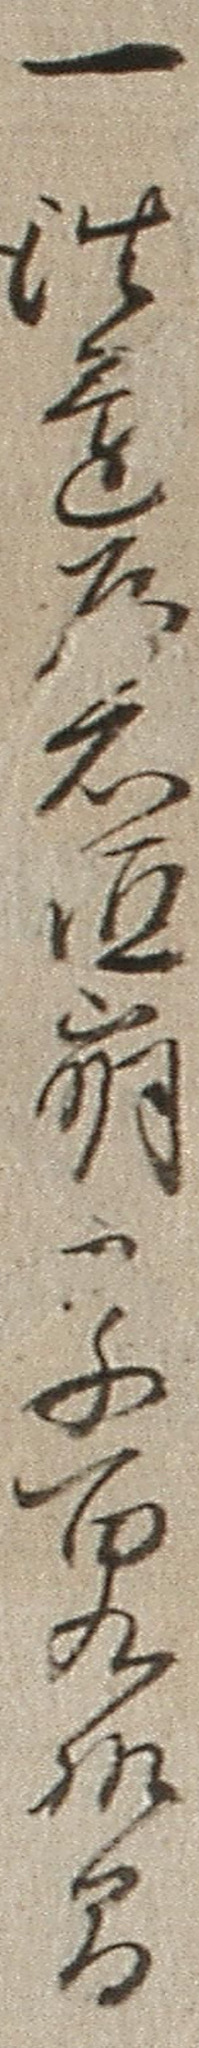一往還道石垣崩九？千百九拾間
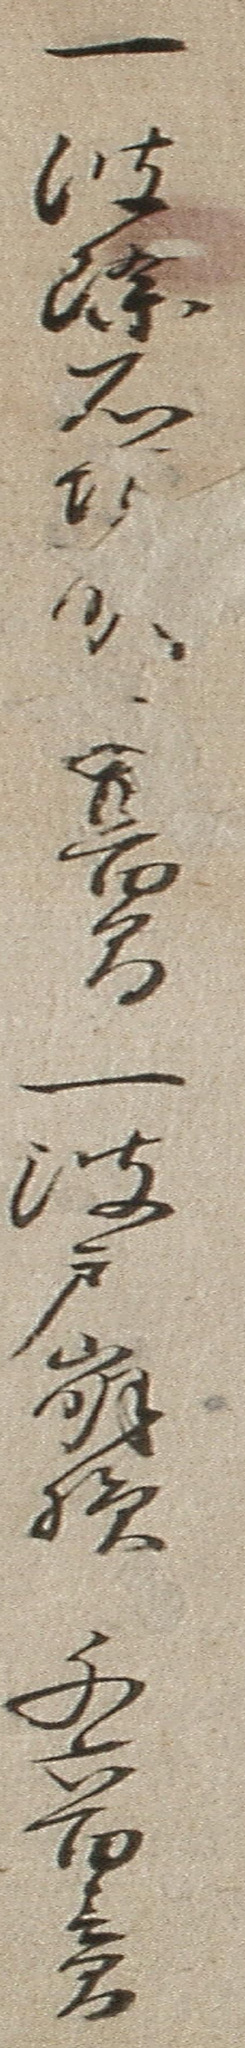一波除石垣崩弐百間一波戸崩損千六百壱間
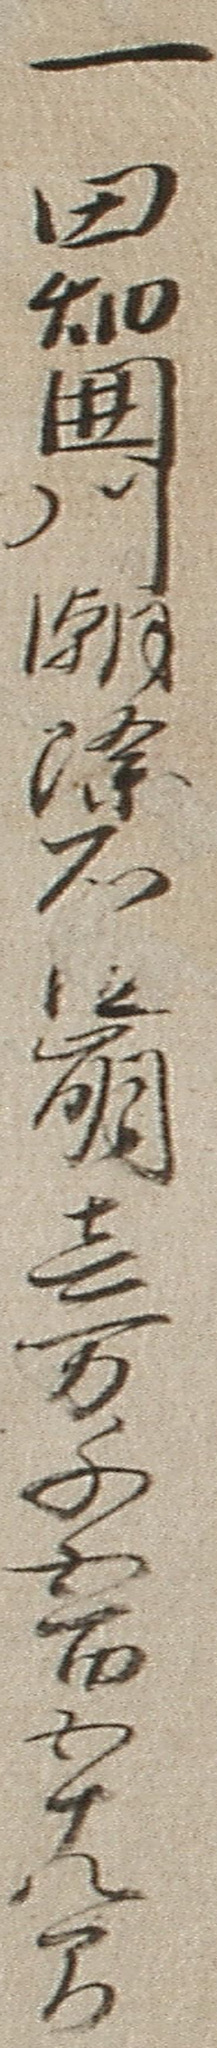一田畑囲川潮除石垣崩壱万千五百五十八間
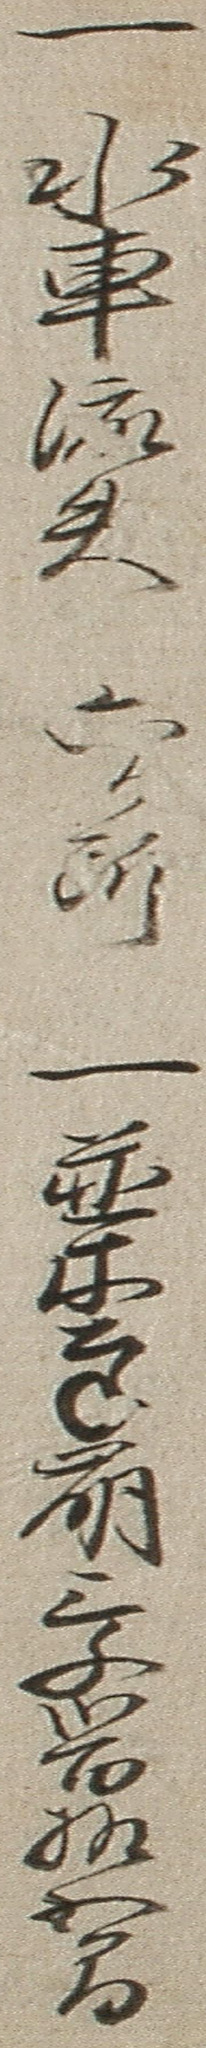一水車流失六ヶ所一並木土手崩三千二百拾五間
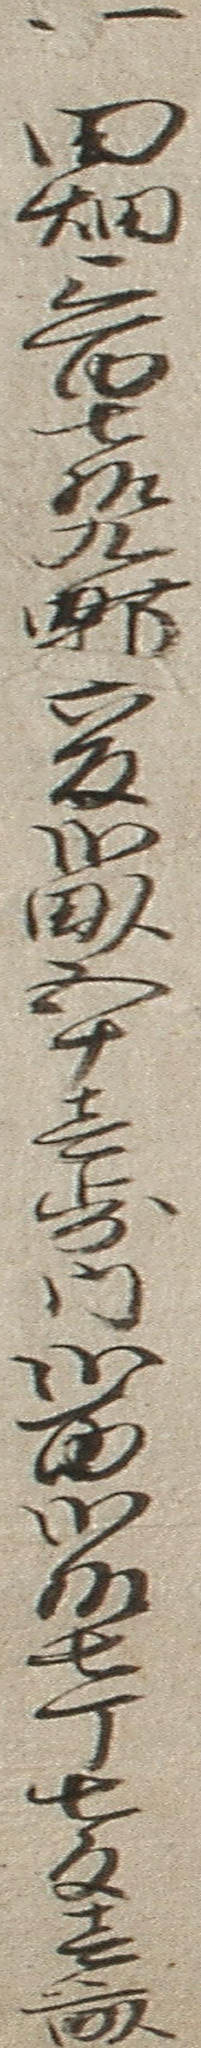一田畑三百七拾九町六反弐畝五十壱歩内弐百弐拾七丁七反壱畝

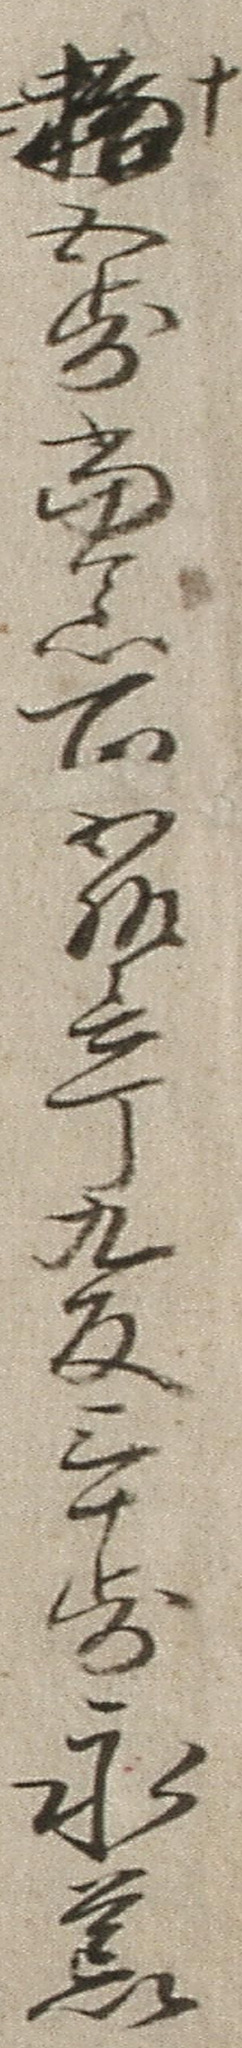十五歩当荒百五拾壱丁九反三十歩永荒
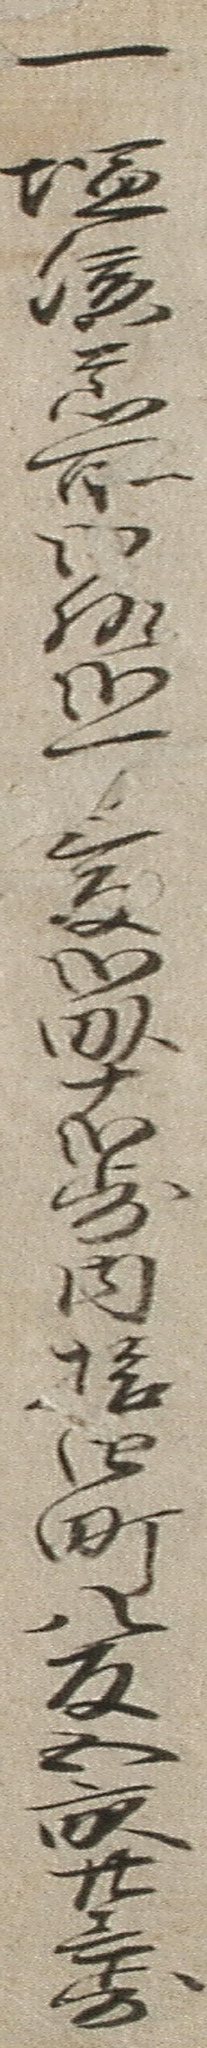一塩浜荒所弐拾弐丁三反弐畝十弐歩内拾四町八反五畝廿壱歩
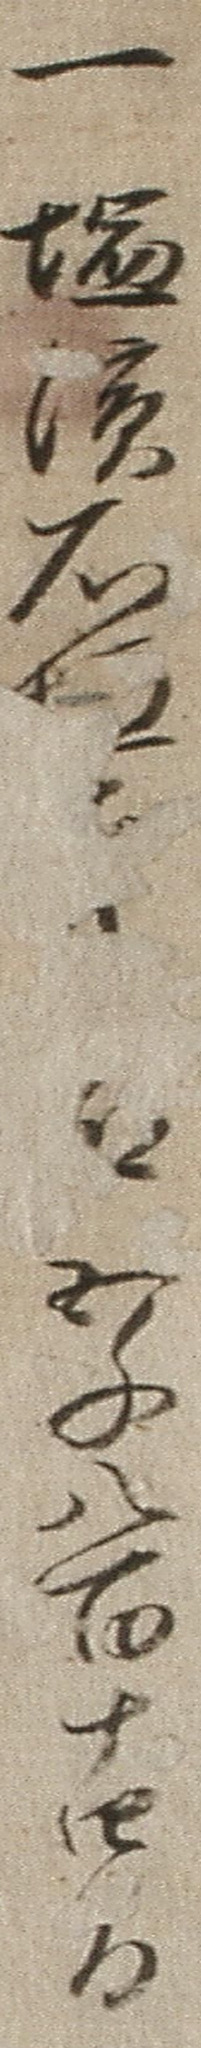一塩浜石垣五千八百十四間
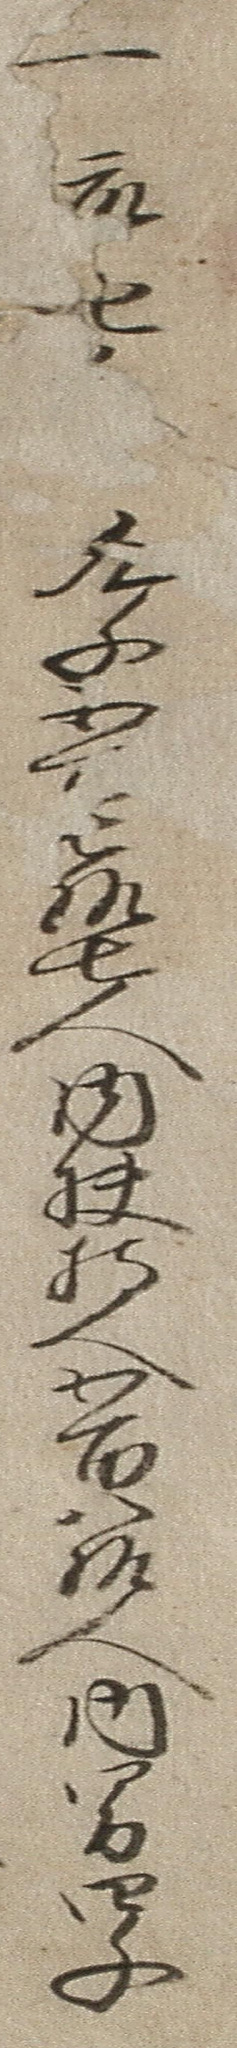一流死九千五百拾七人内扶持人五百八拾人内男四千
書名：太平秘録抜書　浅間山燒及普賢山崩
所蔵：東京大学地震研究所図書室 Earthquake Research Institute Library, The University of Tokyo, JAPAN
